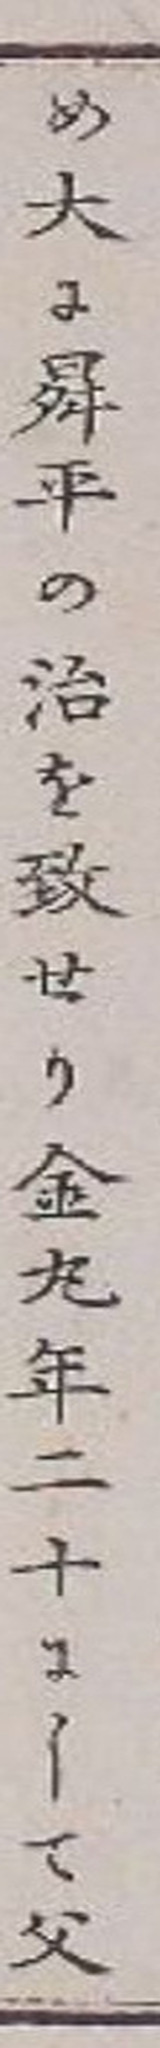め大に昇平の治を致せり金丸年二十にして父
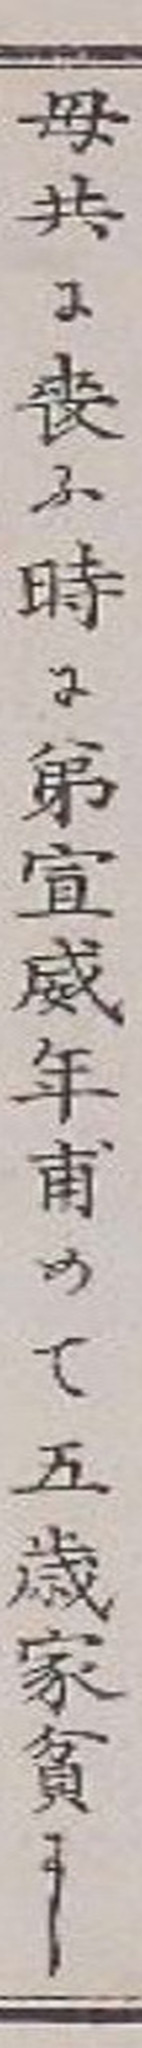母共に喪ふ時に弟宣威年甫めて五歳家貧にし
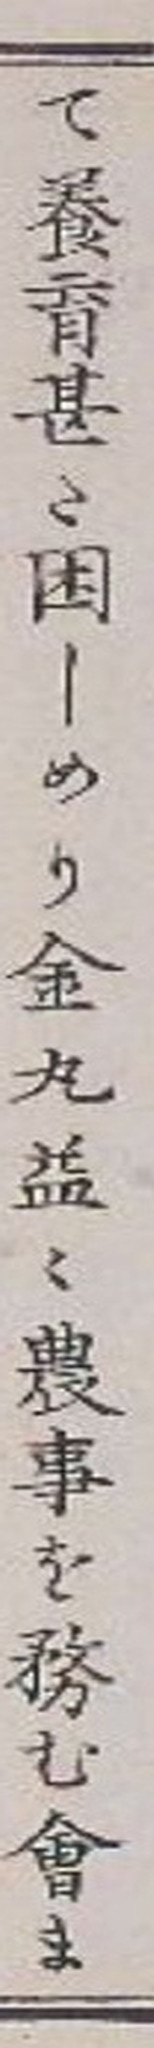て養育甚た困しめり金丸益々農事を務む会ま
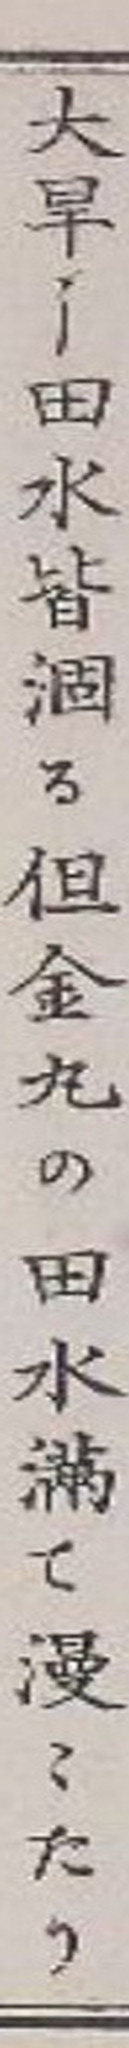大旱し田水皆涸る但金丸の田水満て漫々たり
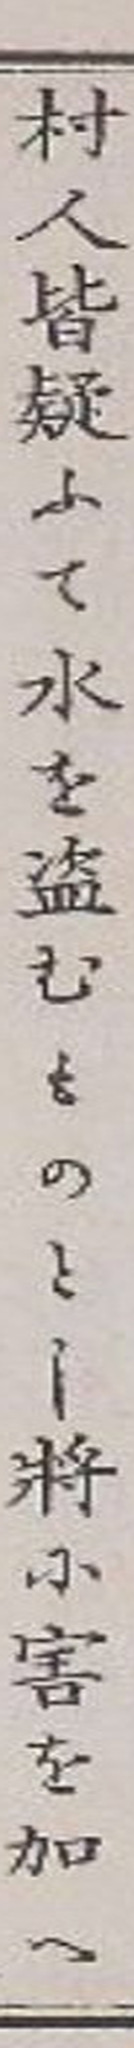村人皆疑ふて水を盗むものとし将に害を加へ
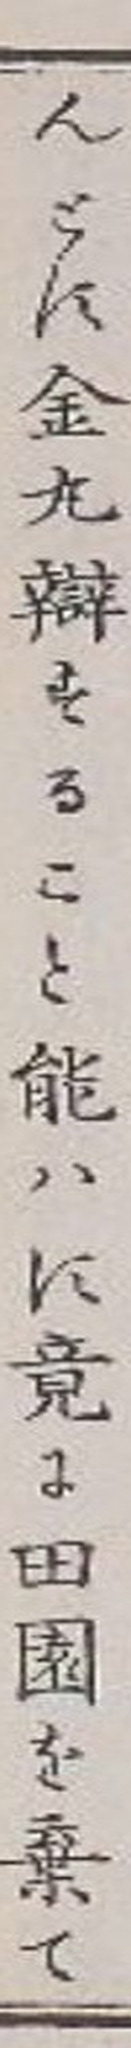んとす金丸弁すること能はす竟に田園を棄て
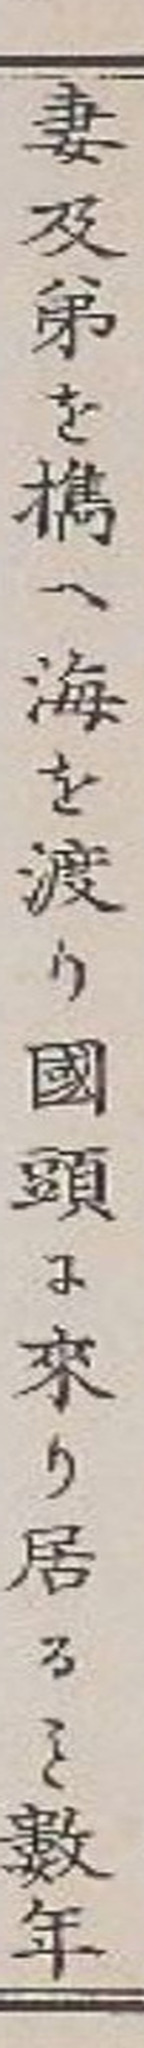妻及ひ弟を携へ海を渡り国頭に来り居ること数年
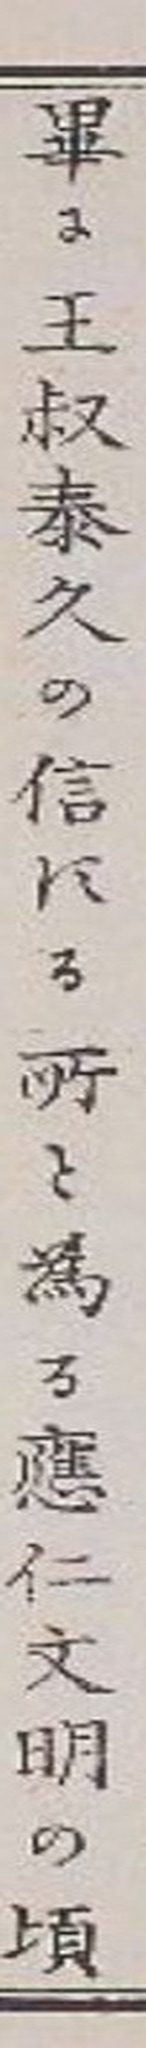畢に王叔泰久の信する所と為る応仁文明の頃
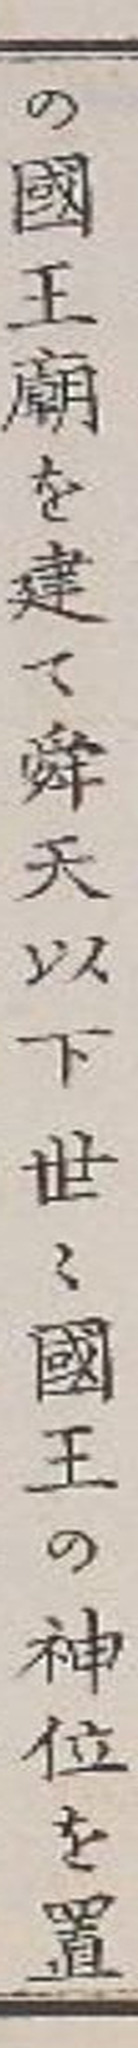の国王廟を建て舜天以下世々国王の神位を置
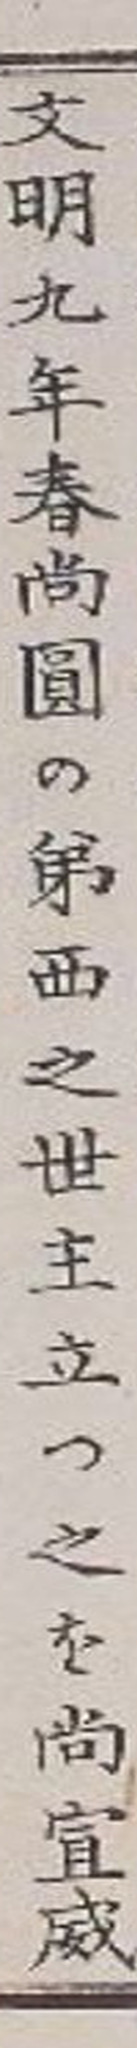文明九年春尚円の弟西之世主立つ之を尚宣威
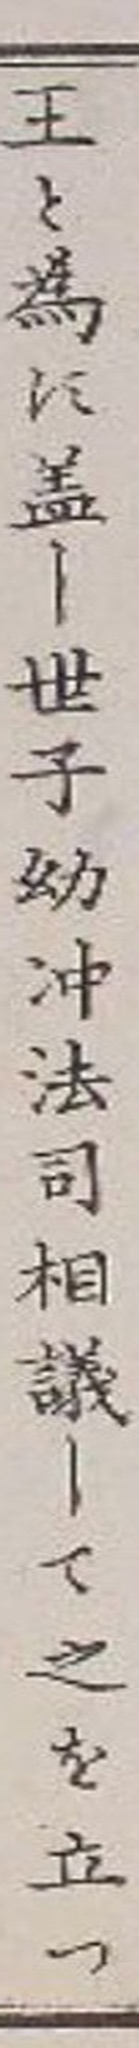王と為す蓋し世子幼冲法司相議して之を立つ
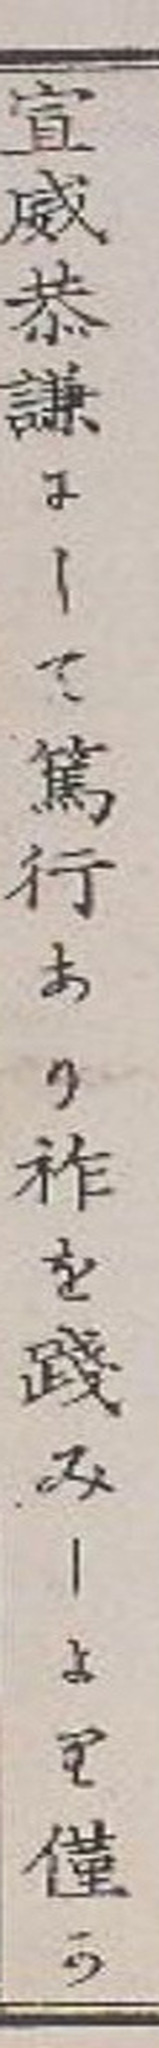宣威恭謙にして篤行あり祚を践みしより僅か

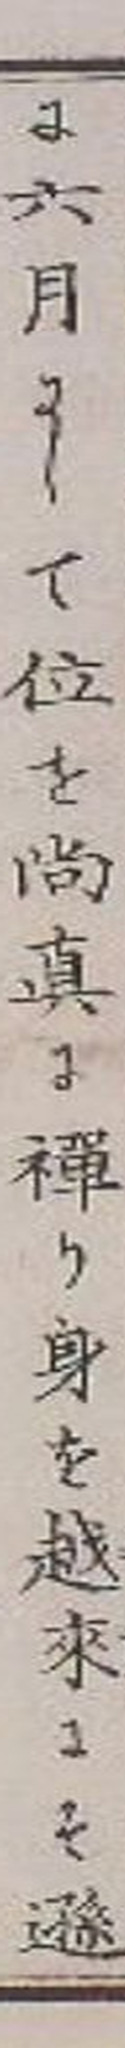に六月にして位を尚真に禅り身を越来にす遜
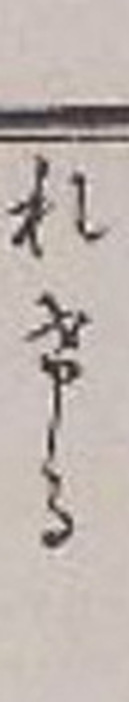れける
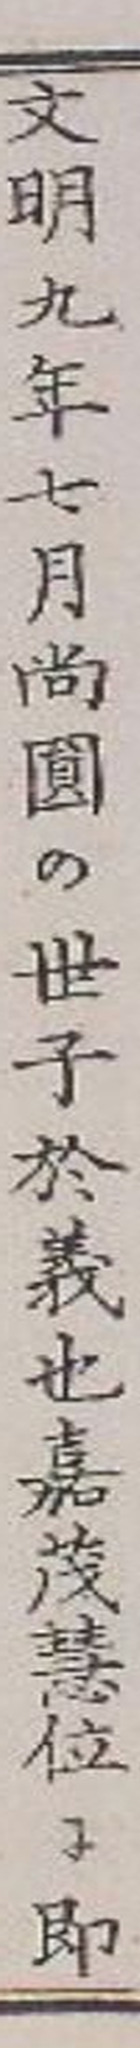文明九年七月尚円の世子於義也嘉茂慧位に即
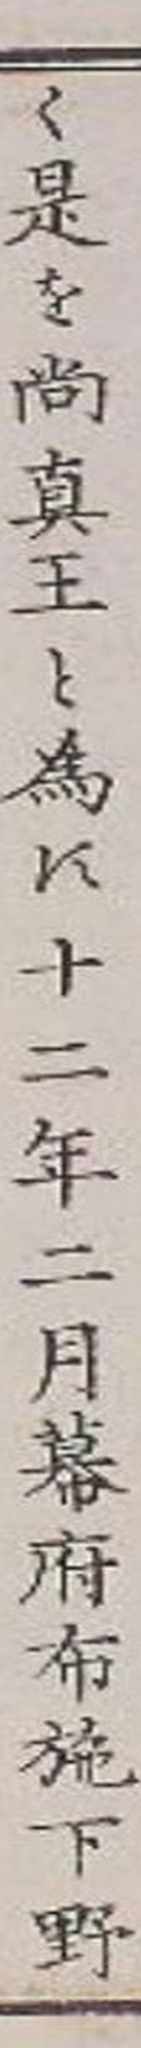く是を尚真王と為す十二年二月幕府布施下野
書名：南島紀事 中
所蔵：University of the Ryukyus Library
